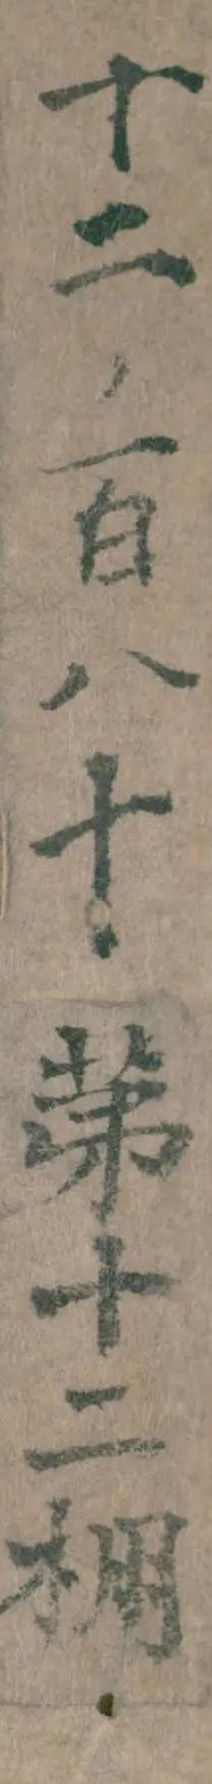十二ノ百八十第十二棚
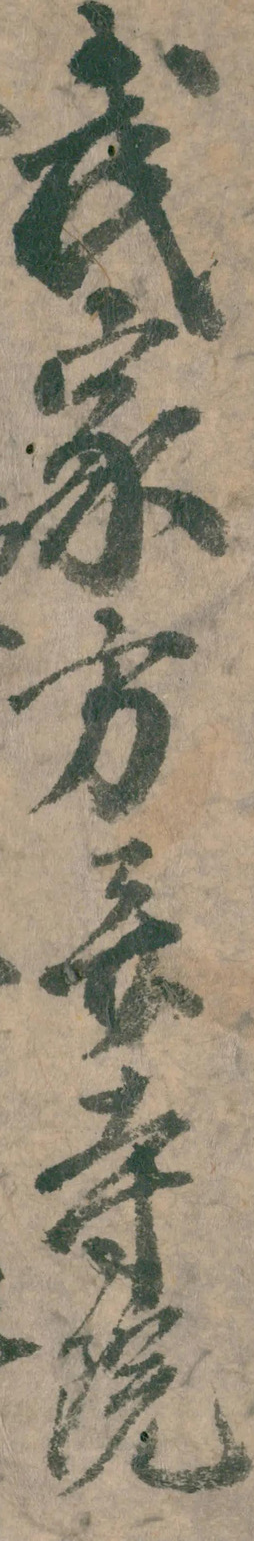武家方并寺院
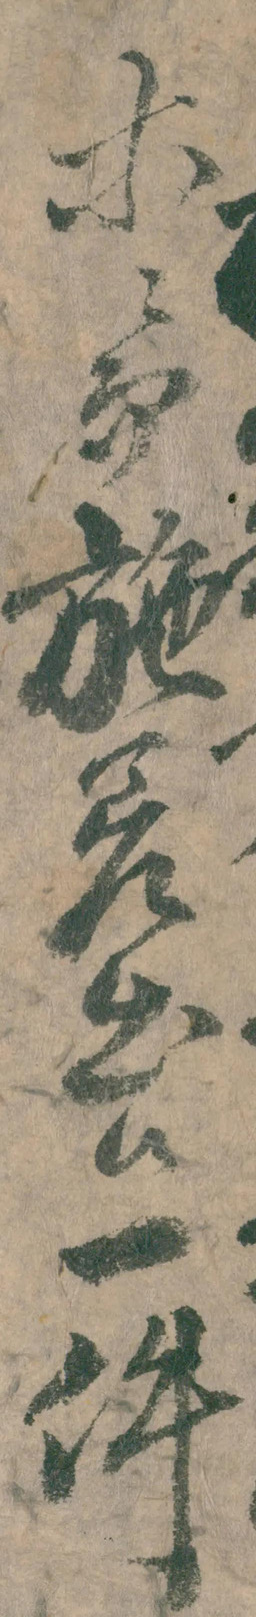等ニ而施差出候一件

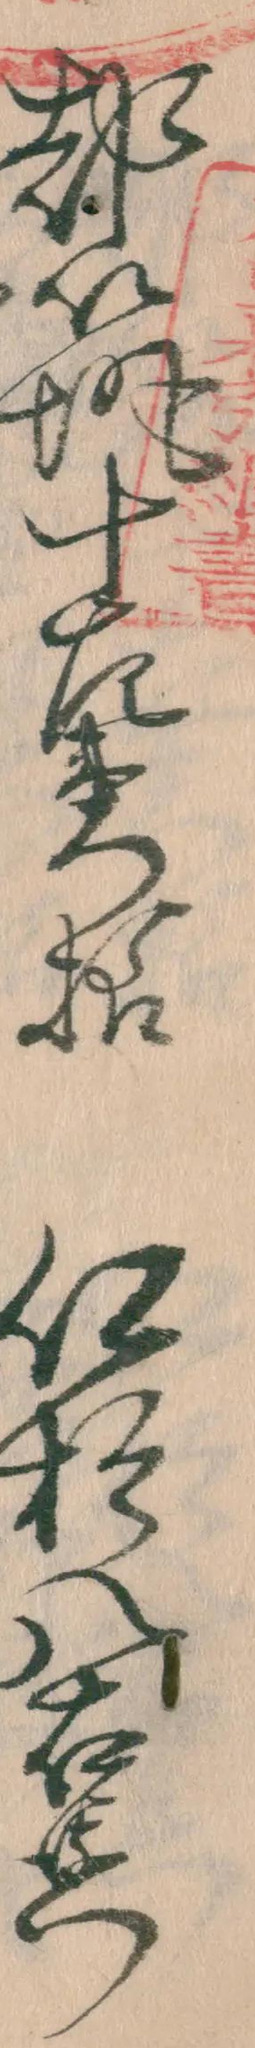都筑十左衛門様仁杉八右衛門
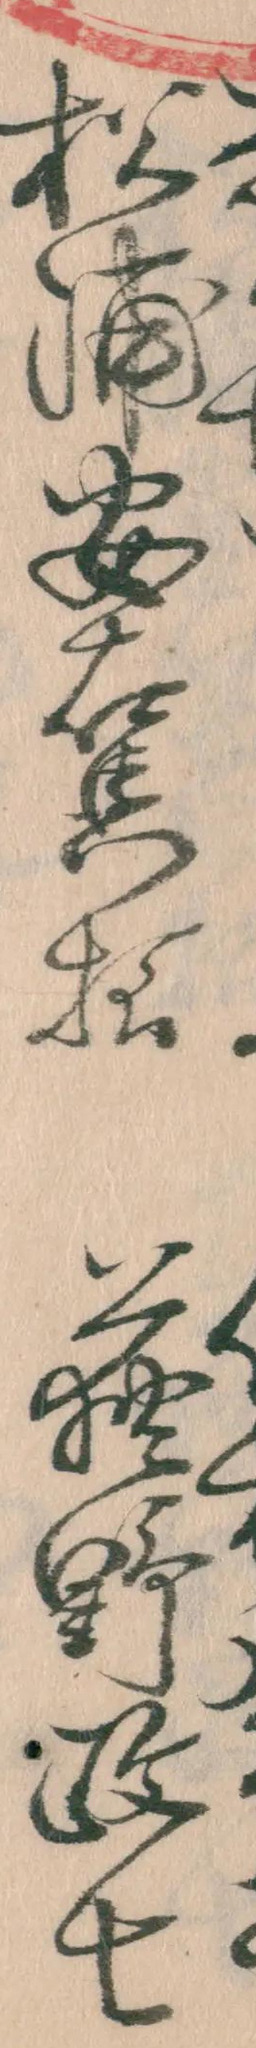松浦安右衛門様荻野政七
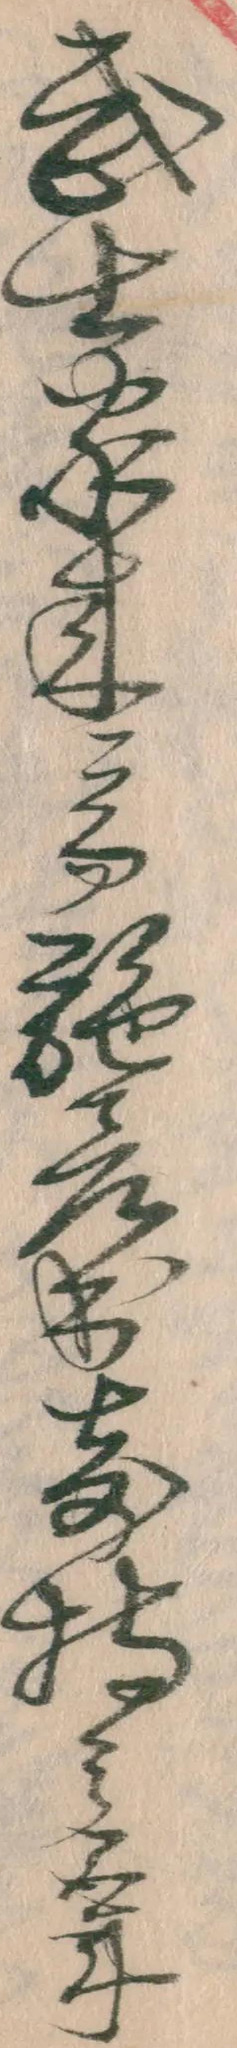武士家来ニ而施差出奇特之事
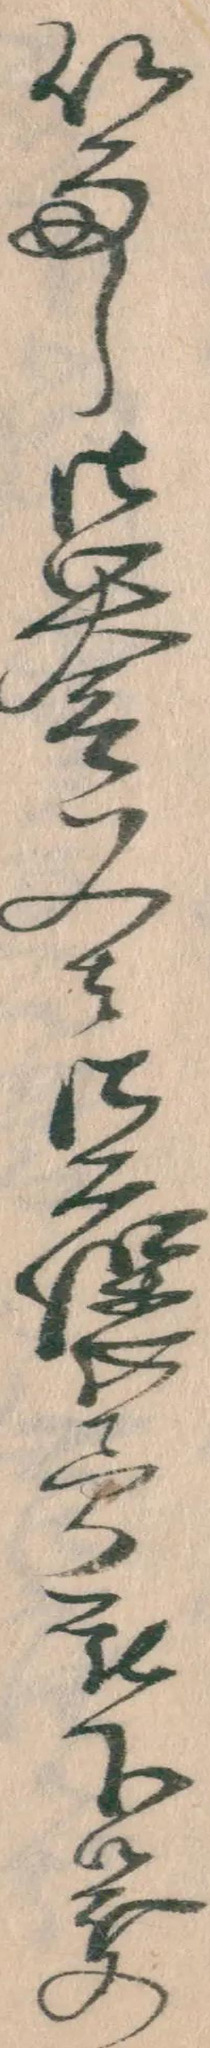いたし御誉又は御褒美被下候もの
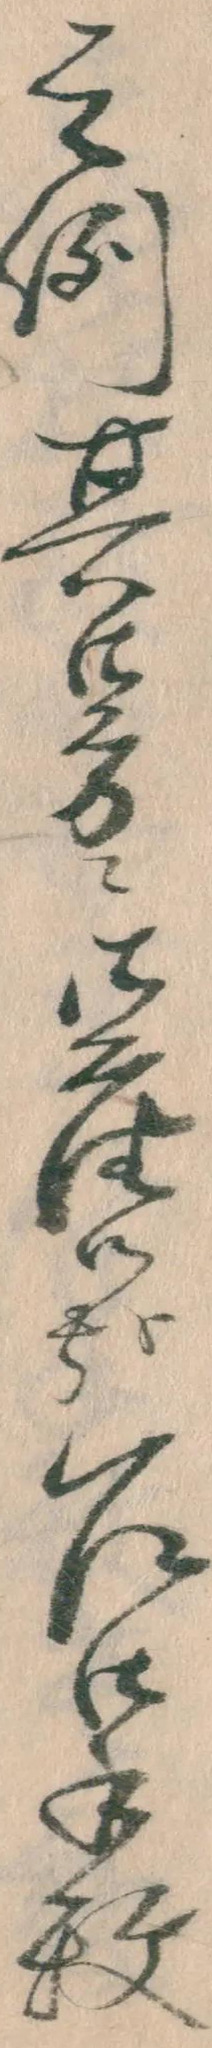之例其御方ニ御座候哉乍御手数
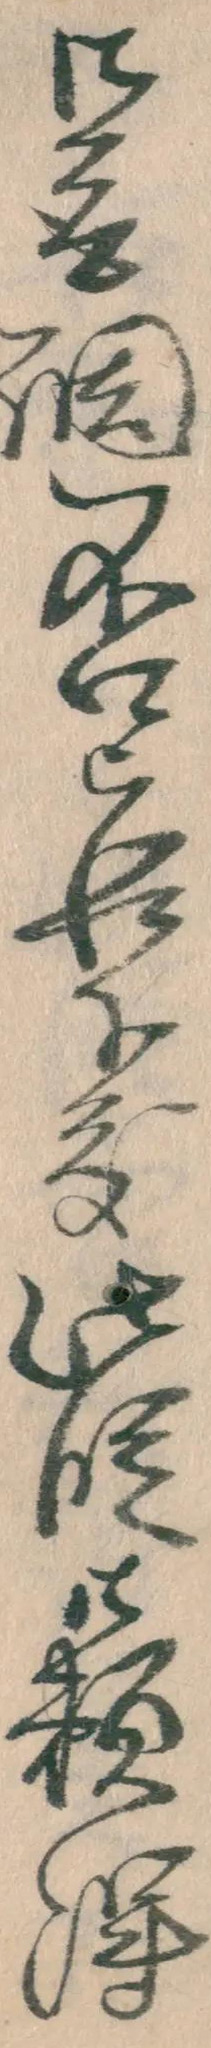御取調否被仰下度此段御頼得
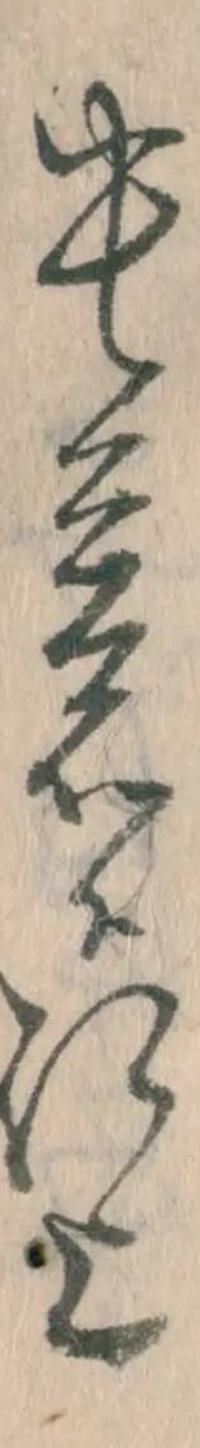貴意候以上

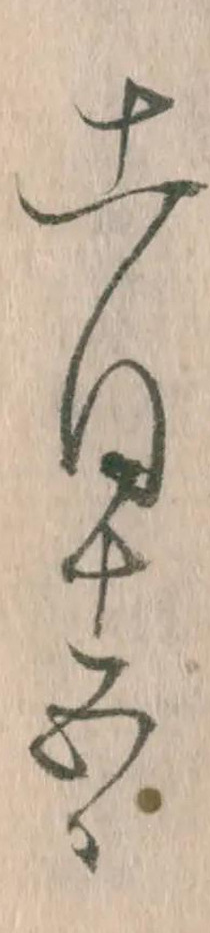十一月十五日
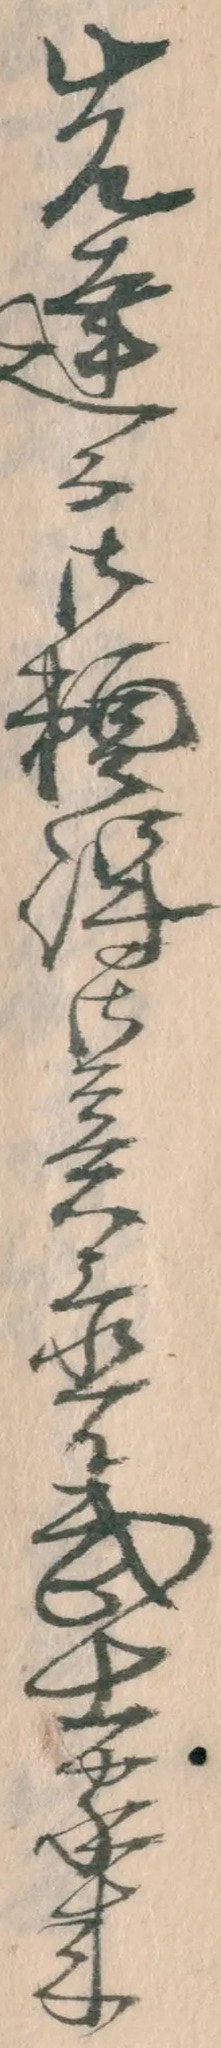先達而御頼得御意置候武士家来
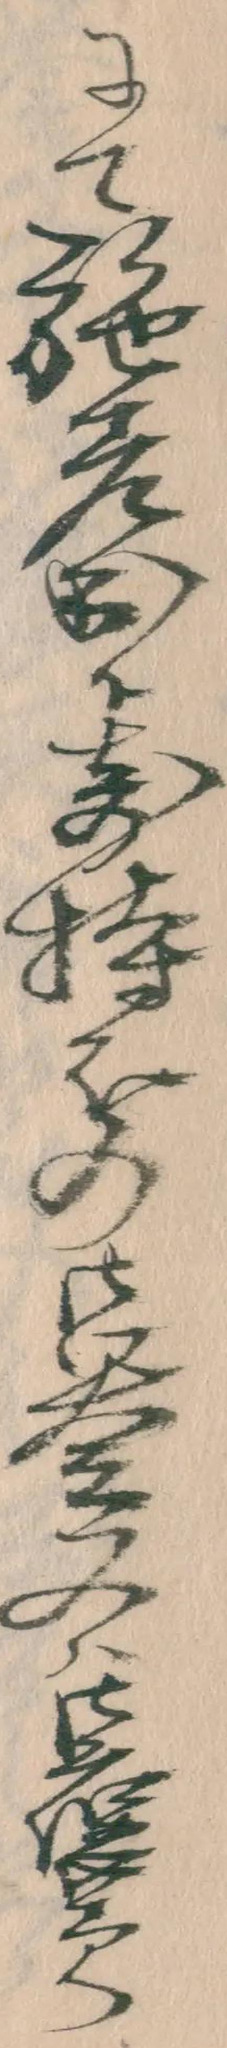にて施差出候奇特もの御誉又ハ御褒美
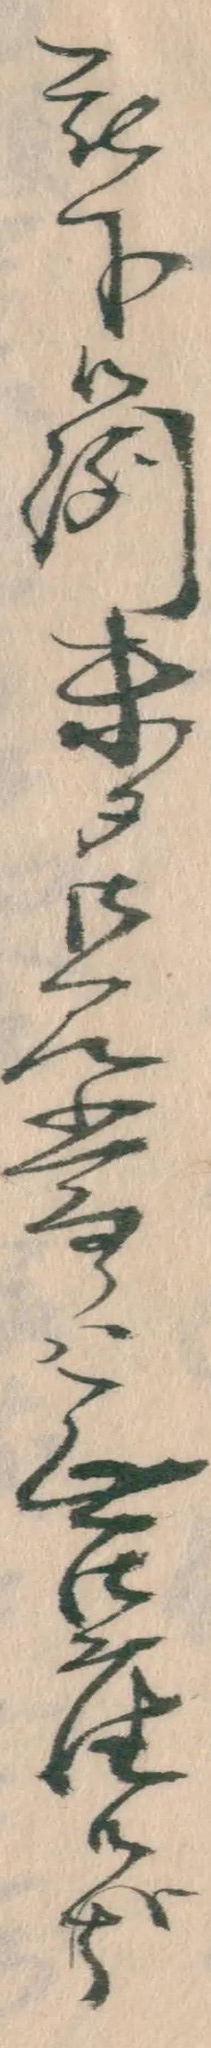被下候例未タ御見書ハ無御座候哉
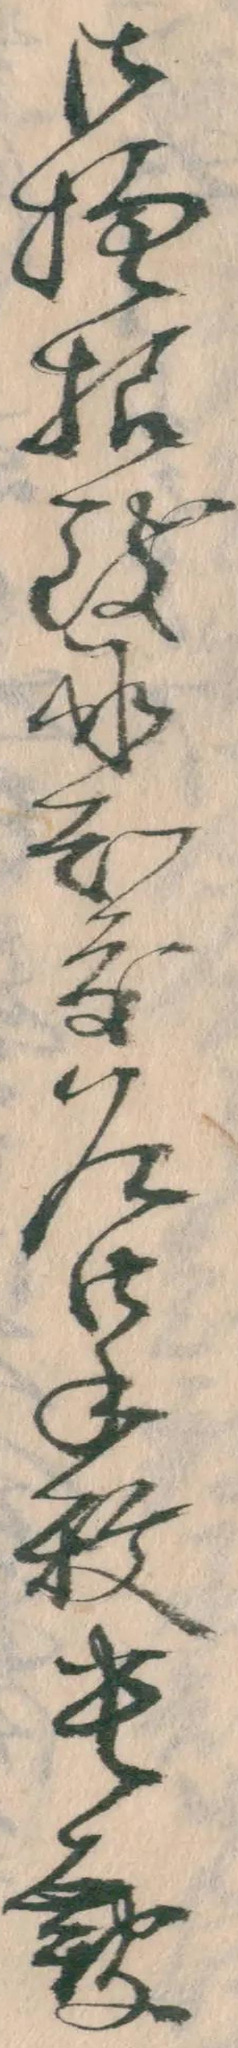御模様致承知度乍御手数貴報
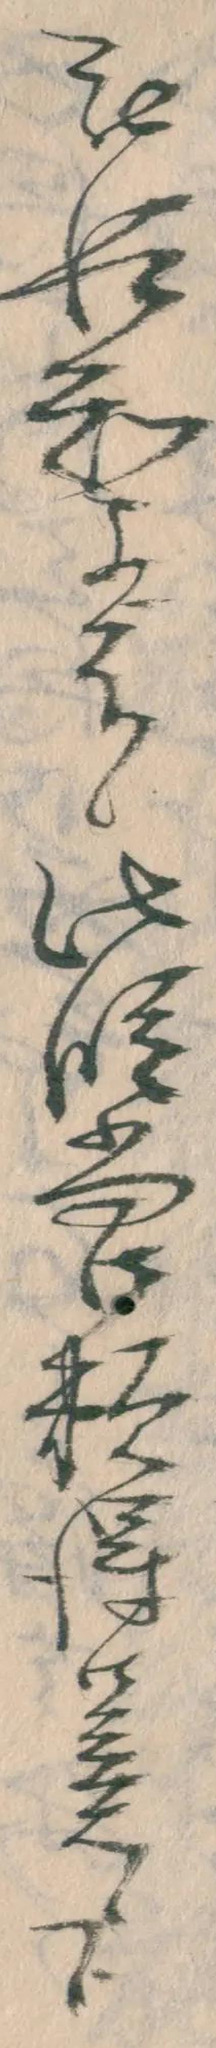被仰知可被下候此段尚御頼得御意候以上
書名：武家方并寺院等ニテ施差出候一件
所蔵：国立国会図書館 National Diet Library, JAPAN
